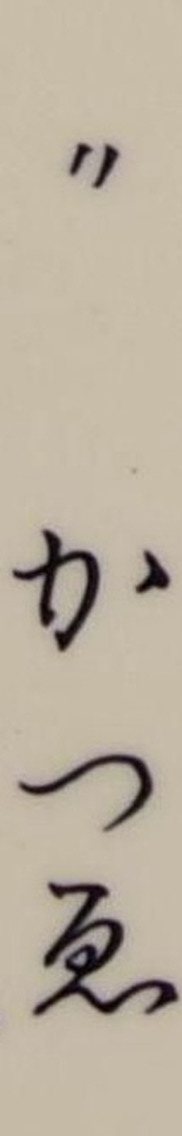かつえ
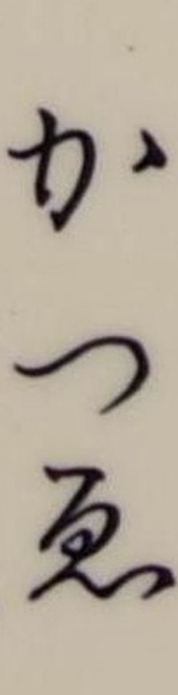かつえ
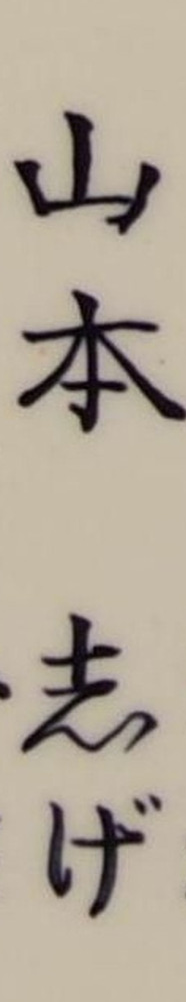山本しげ

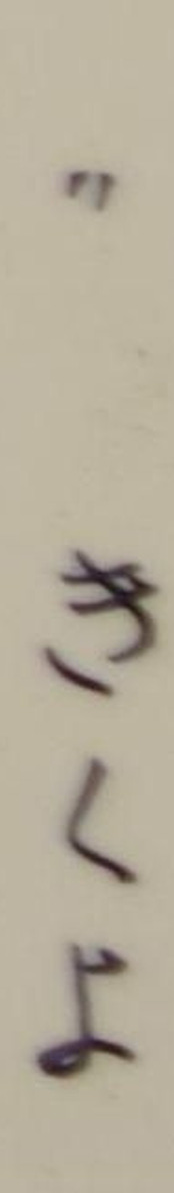きくよ
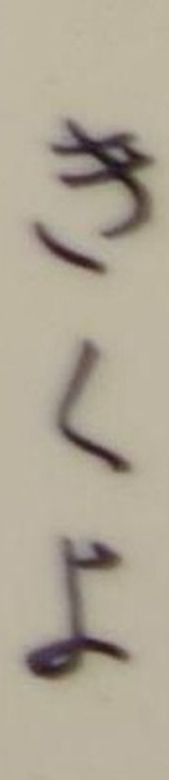きくよ
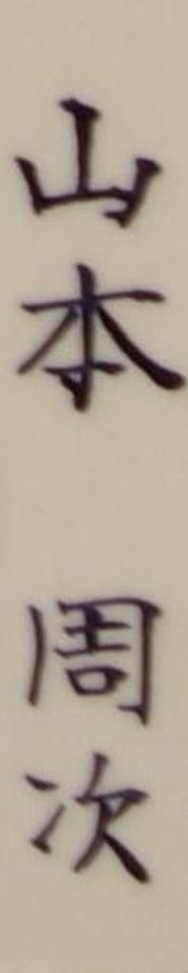山本周次
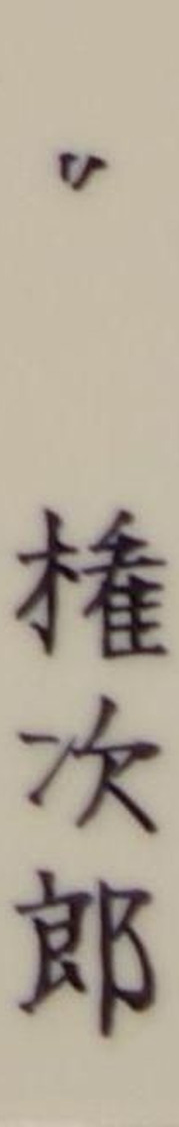権次郎
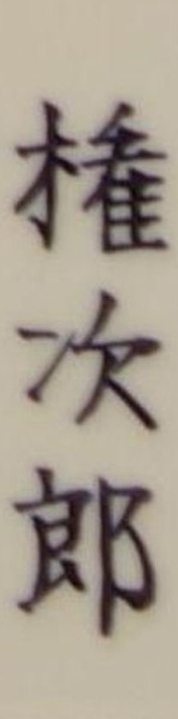権次郎
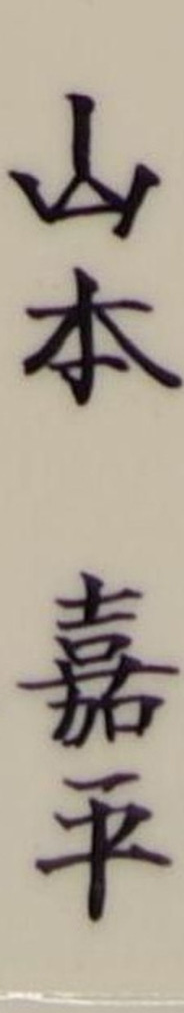山本嘉平
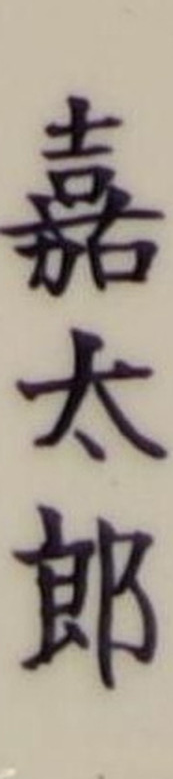嘉太郎
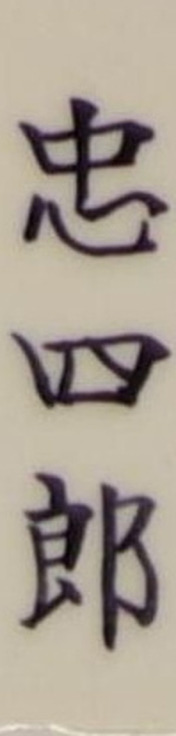忠四郎
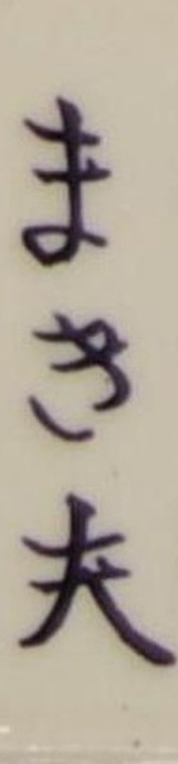まき夫

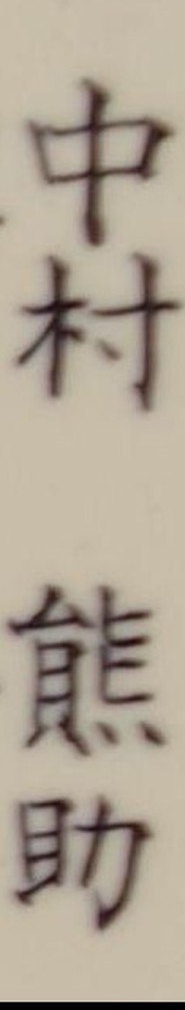中村熊助
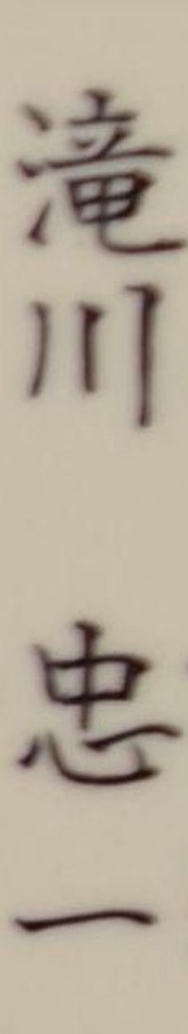滝川忠一
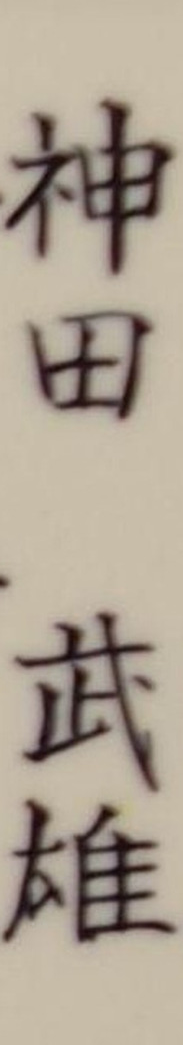神田武雄
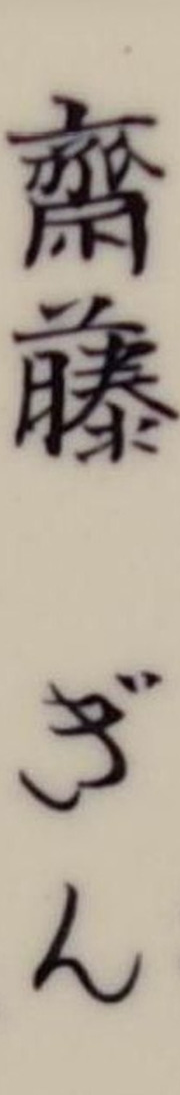斎藤ぎん
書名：M~S
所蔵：高野山金剛峯寺
